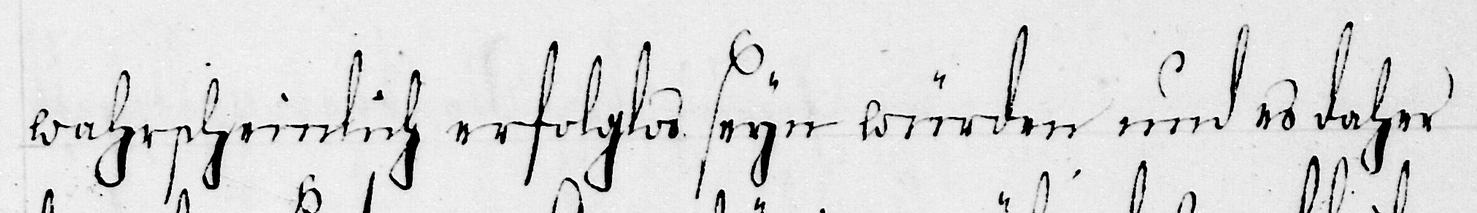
wahrscheinlich erfolglos seyn würden und es daher
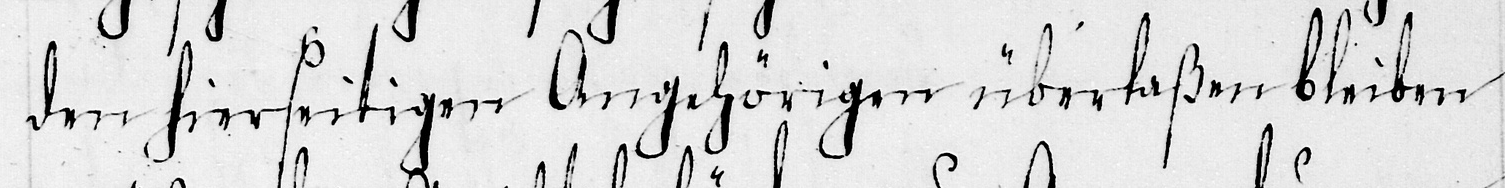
den hierseitigen Angehörigen überlaßen bleiben
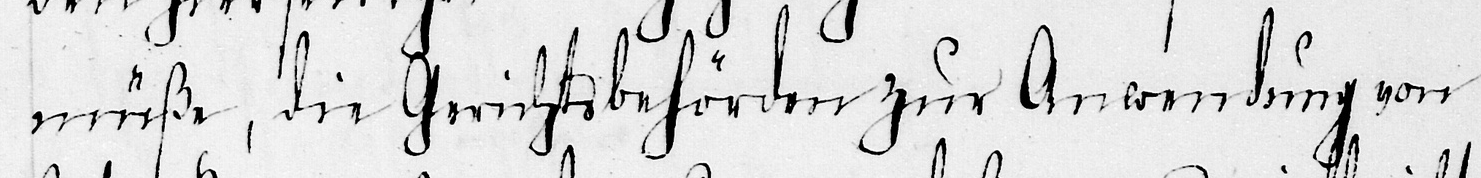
müße, die Gerichtsbehörden zur Anwendung von
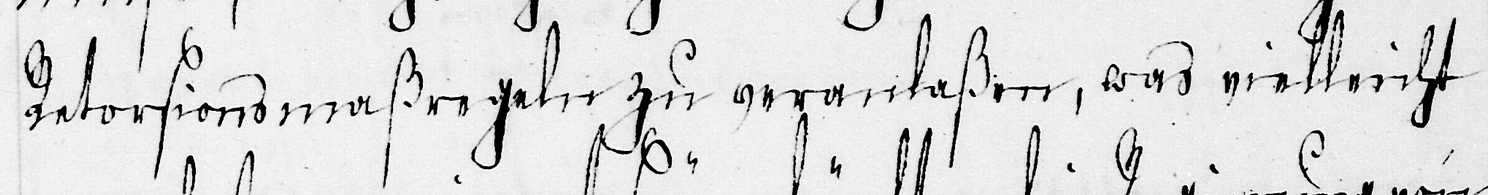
Retorsionsmaßregeln zu veranlaßen, was vielleicht
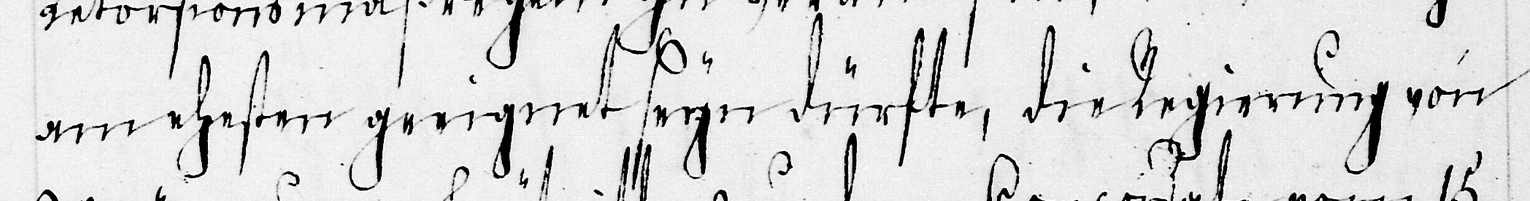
am ehesten geeignet seyn dürfte, die Regierung von
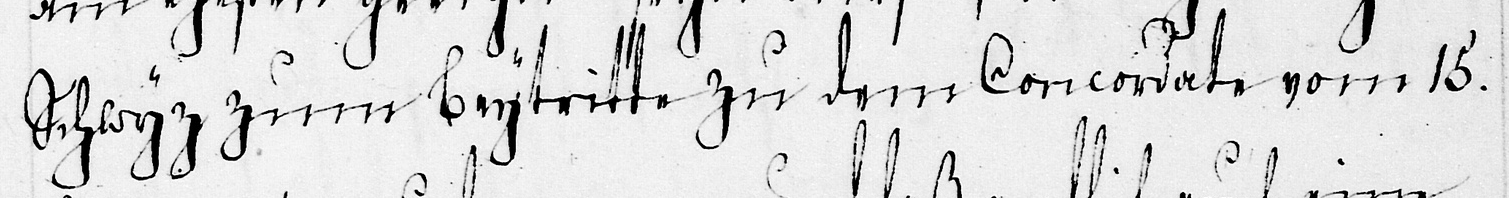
Schwyz zum Beytritte zu dem Concordate vom 15.
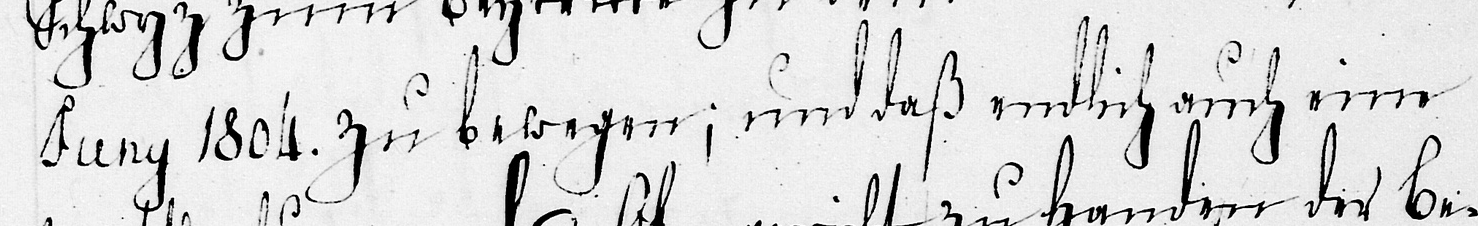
Juny 1804. zu bewegen; und daß endlich auch eine
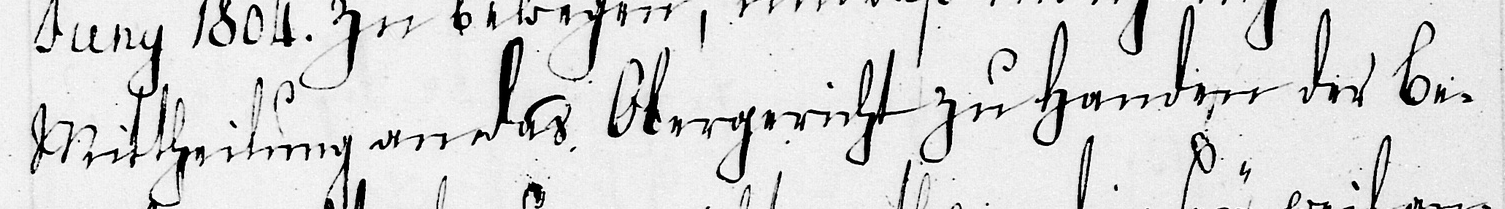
Mittheilung an das Obergericht zu Handen der Be¬
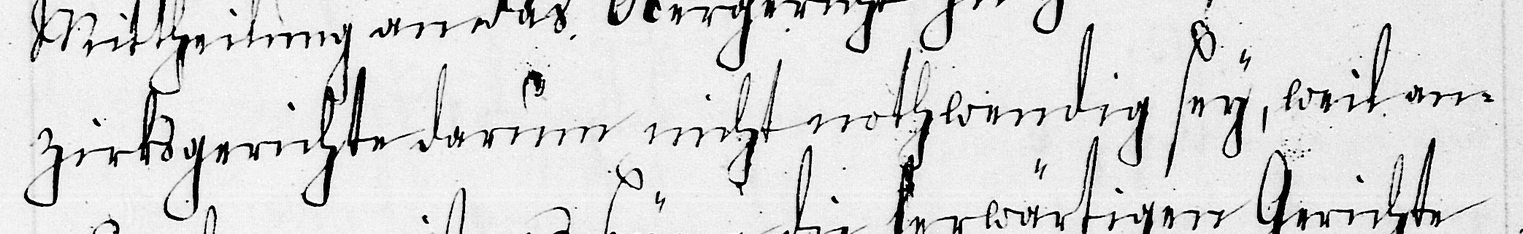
zirksgerichte darum nicht nothwendig sey, weil an¬
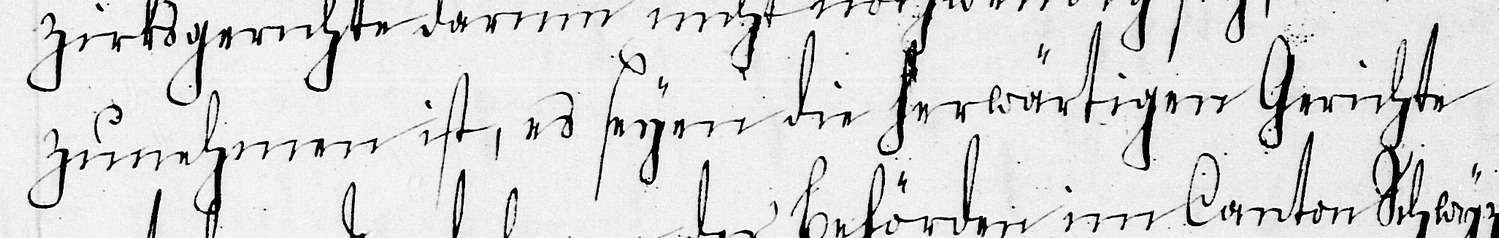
zunehmen ist, es seyen die herwärtigen Gerichte
